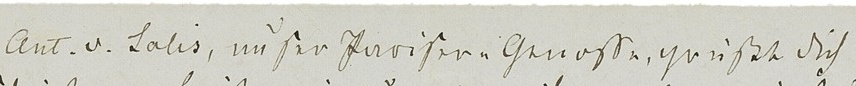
Ant. v. Salis, unser Pariser-Genosse, grüßt dich
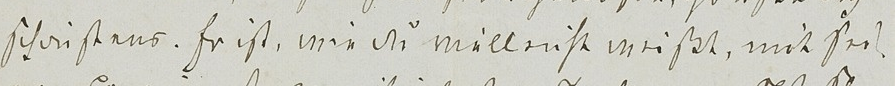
schönstens. Er ist, wie du vielleicht weißt, mit sei-
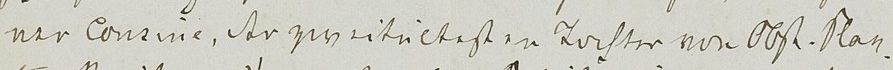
ner Cousine, der zweitältesten Tochter von Obst. Plan-
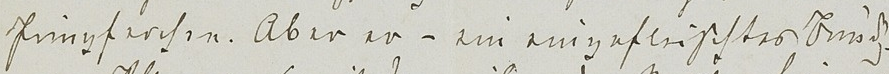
Jüngferchen. Aber er – ein eingefleischtes Bünd-
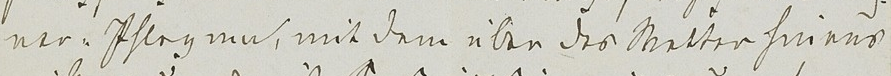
ner-Phlegma, mit dem über das Wetter hinaus
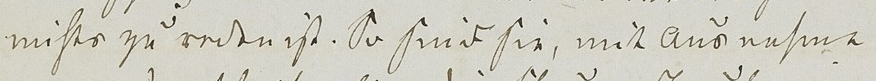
nichts zu reden ist. So sind sie, mit Ausnahme
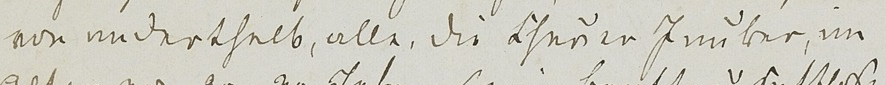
von anderthalb, alle, die Churer Junker, im
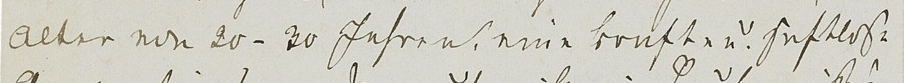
Alter von 20-30 Jahren, eine kraft- u. saftlose
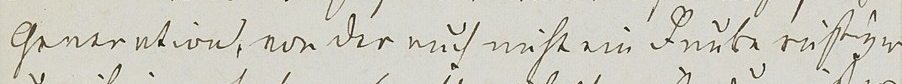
Generation, von der auch nicht ein Funke rüstiger
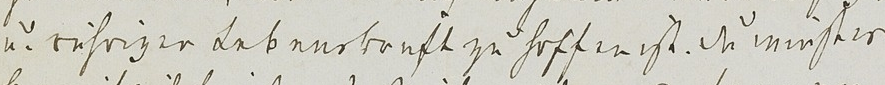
u. rühriger Lebenskraft zu hoffen ist. Du wirst es
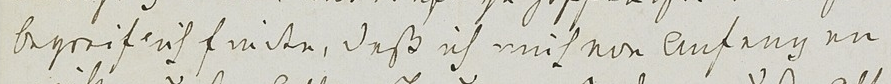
begreiflich finden, daß ich mich von Anfang an
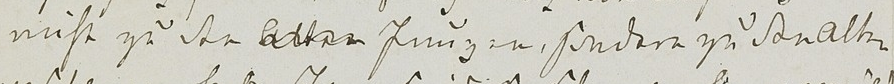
nicht zu den Alten Jungen, sondern zu den Alten
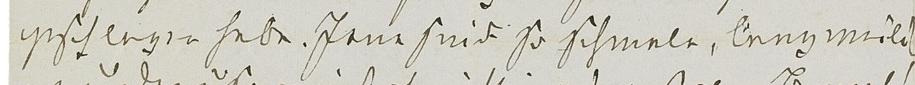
geschlagen habe. Jene sind so schmale, langweili-
